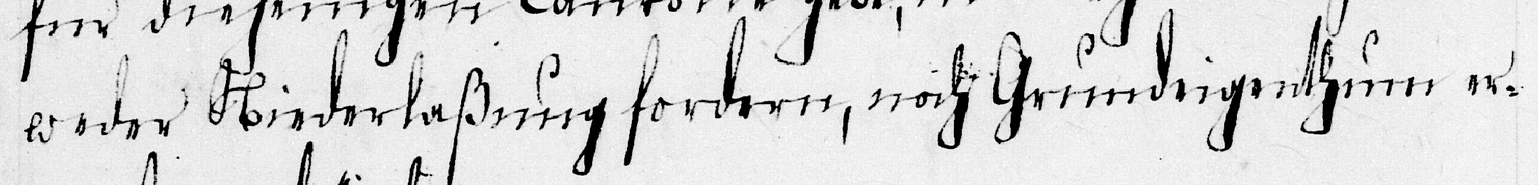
weder Niederlaßung fordern, noch Grundeigenthum er¬
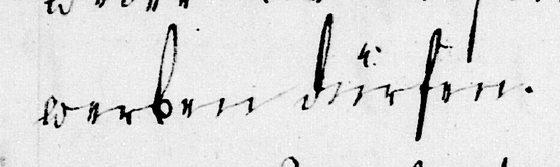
werben dürfen.
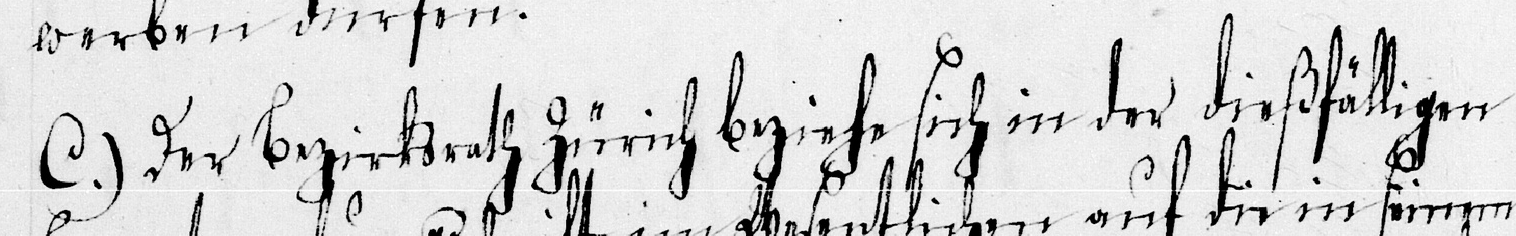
C.) Der Bezirksrath Zürich beziehe sich in der dießfälligen
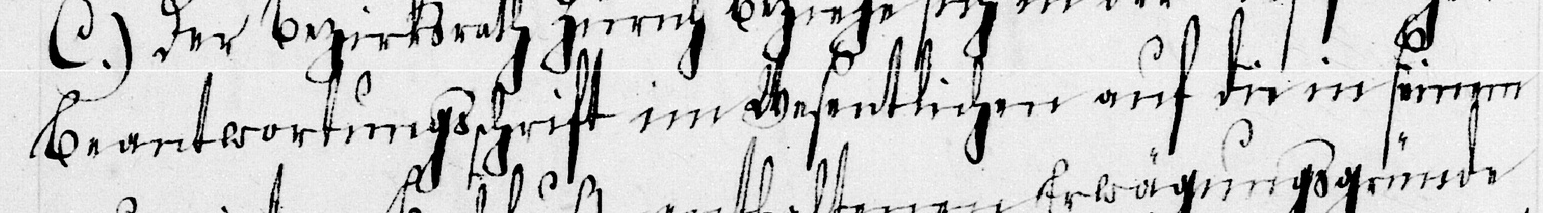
Beantwortungsschrift im Wesentlichen auf die in seinem
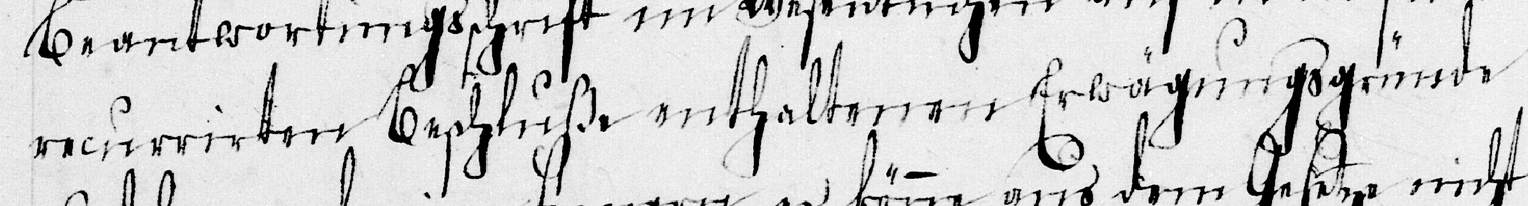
recurrirten Beschluße enthaltenen Erwägungsgründe
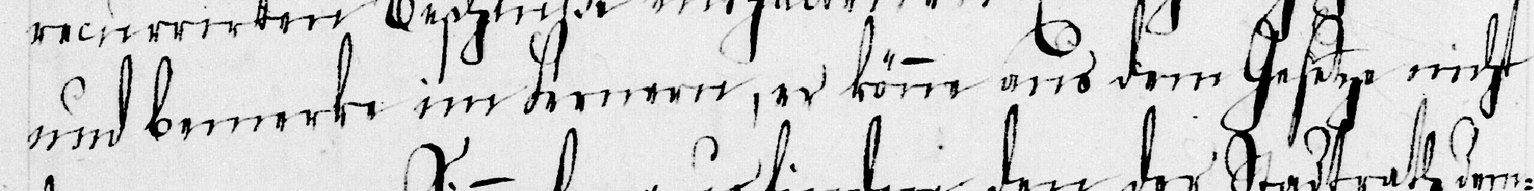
und bemerke im Fernern, er könne aus dem Gesetze nicht
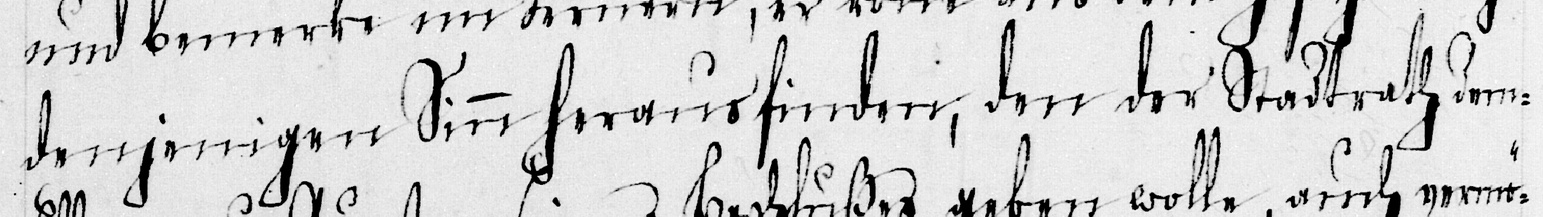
denjenigen Sinn herausfinden, den der Stadtrath dem¬
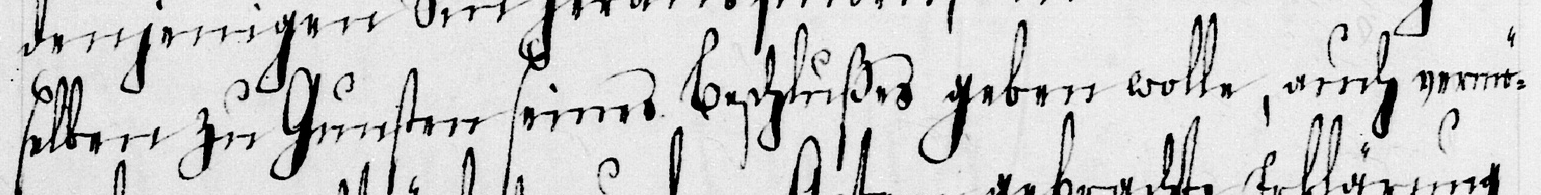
selben zu Gunsten seines Beschlußes gebe wolle, auch vermö¬
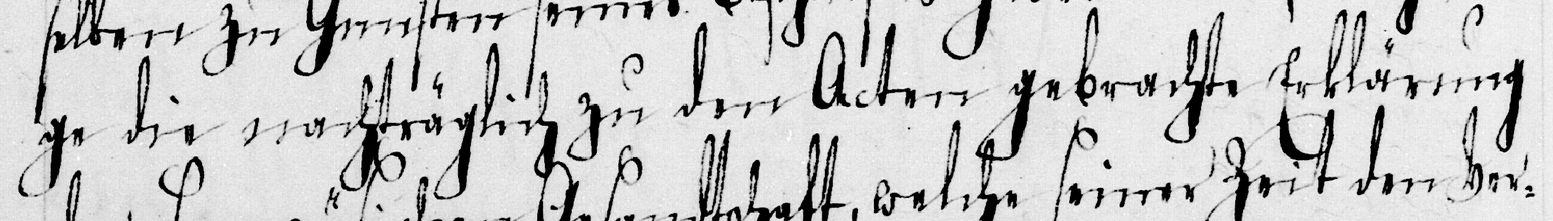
ge die nachträglich zu den Acten gebrachte Erklärung
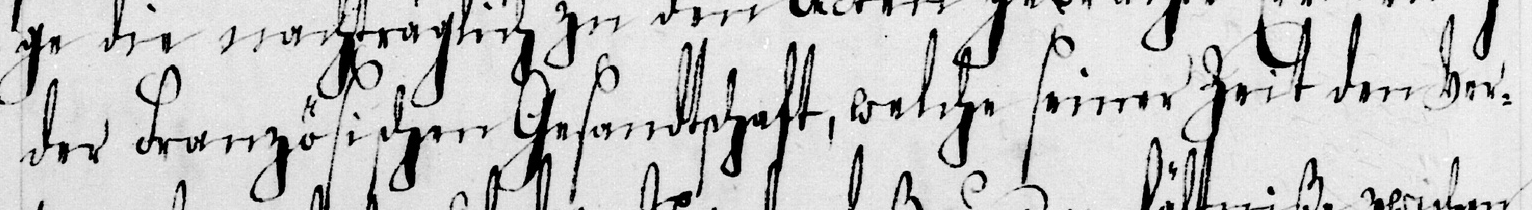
der Französischen Gesandtschaft, welche seiner Zeit den Ver¬
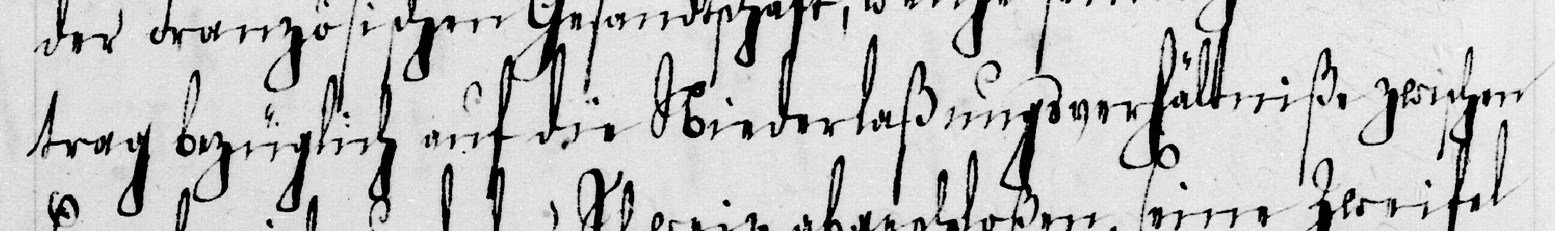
trag bezüglich auf die Niederlaßungsverhältniße zwischen
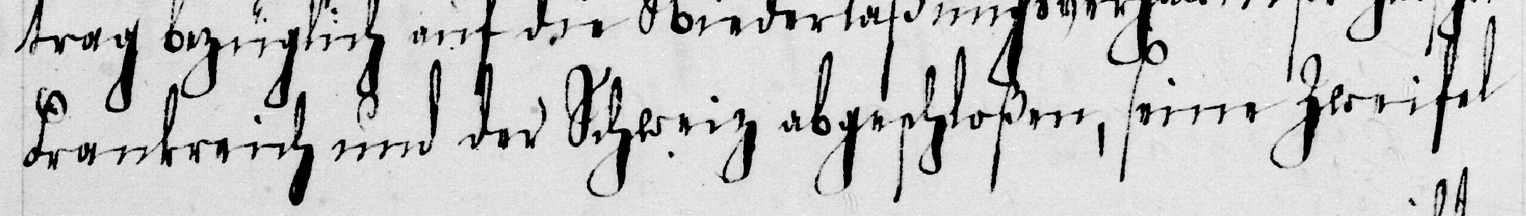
Frankreich und der Schweiz abgeschloßen, seine Zweifel
